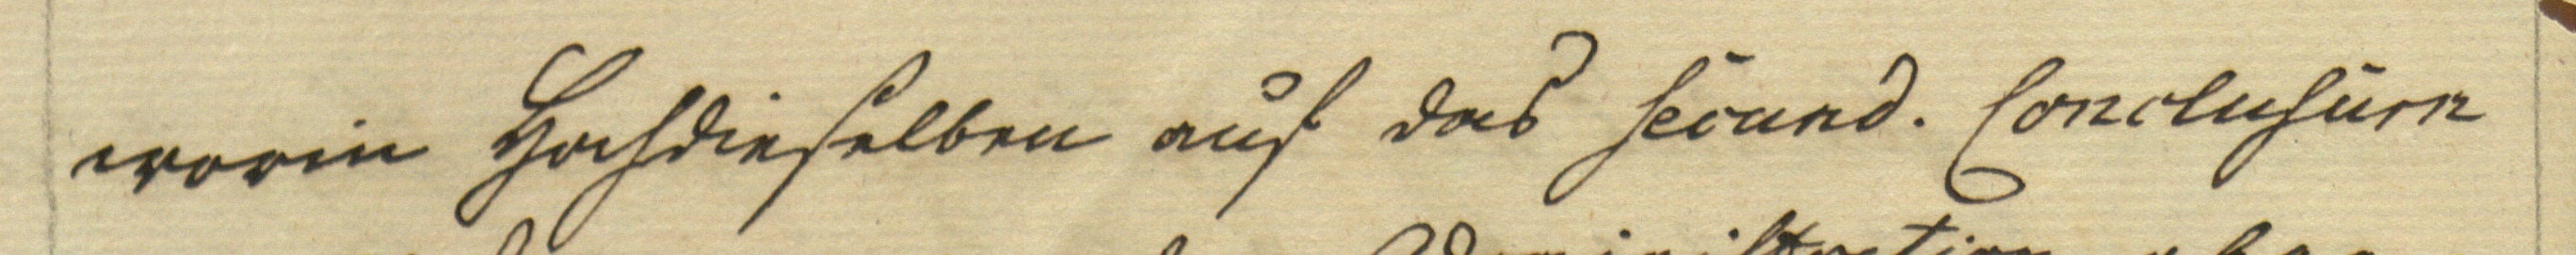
worin Hochdieselben auf das secund. Conclusum
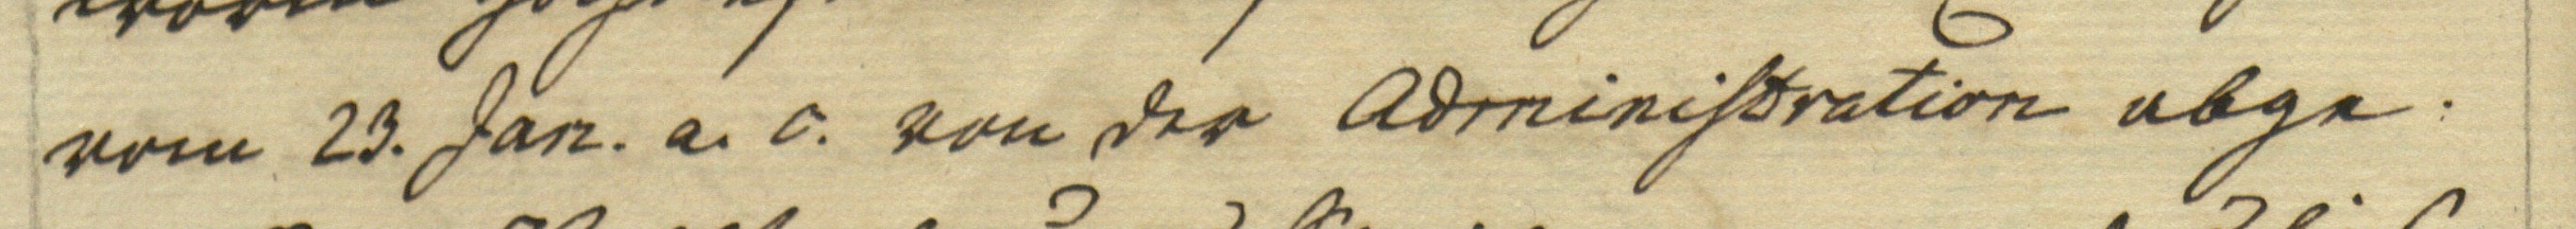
vom 23. Jan. a. c. von der Administration abge¬
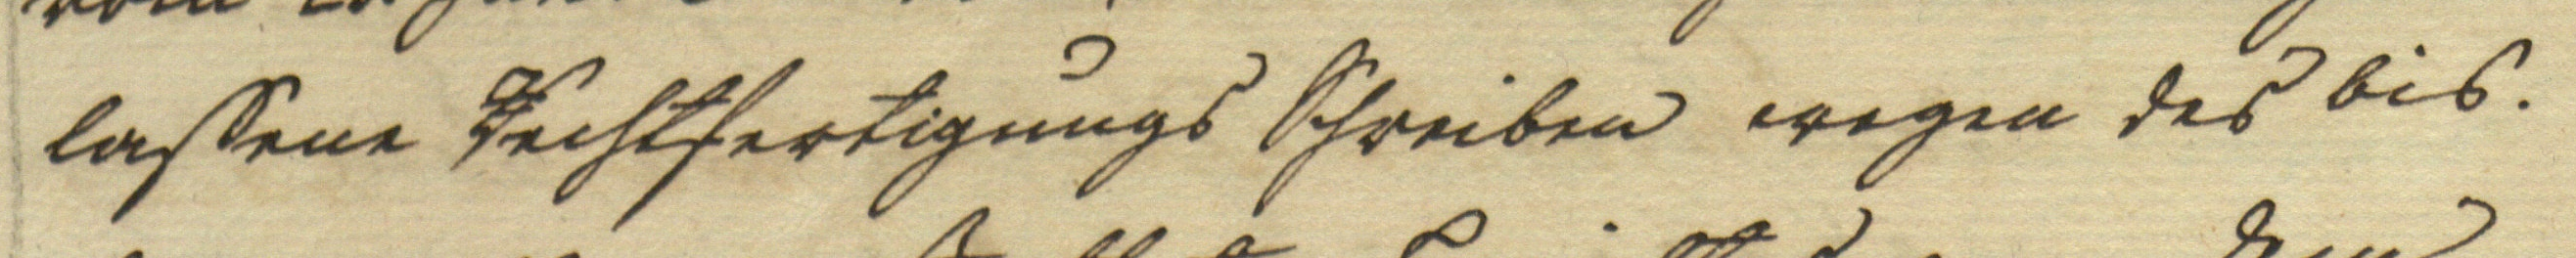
lassene Rechtfertigungs Schreiben wegen des bis¬
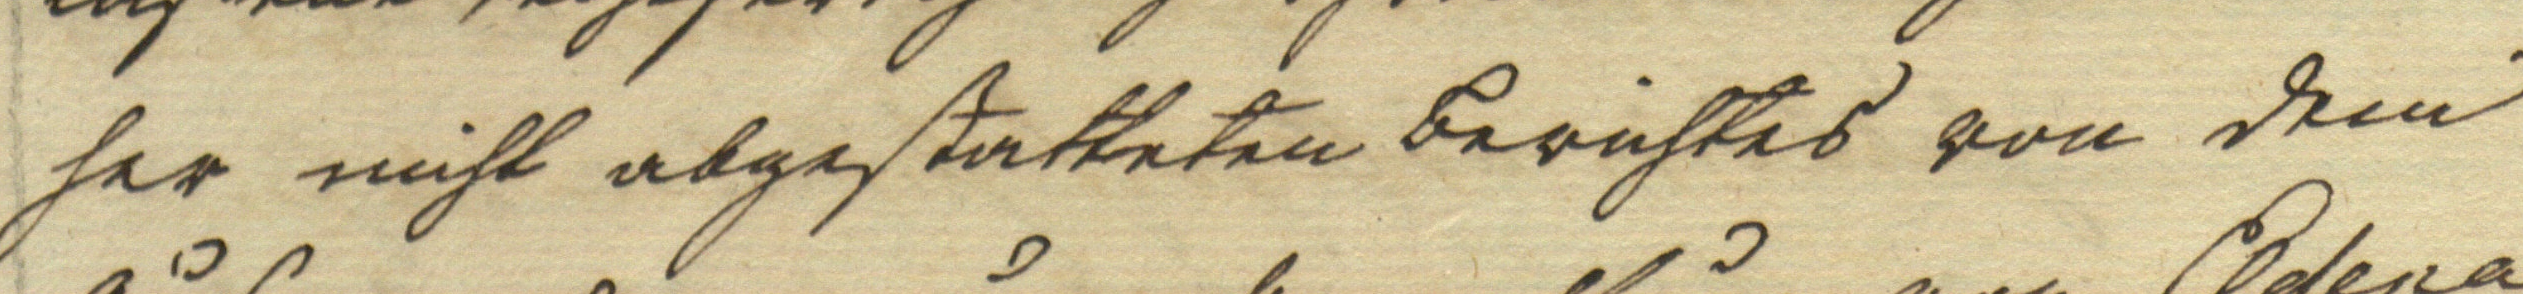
her nicht abgestatteten Berichtes von dem
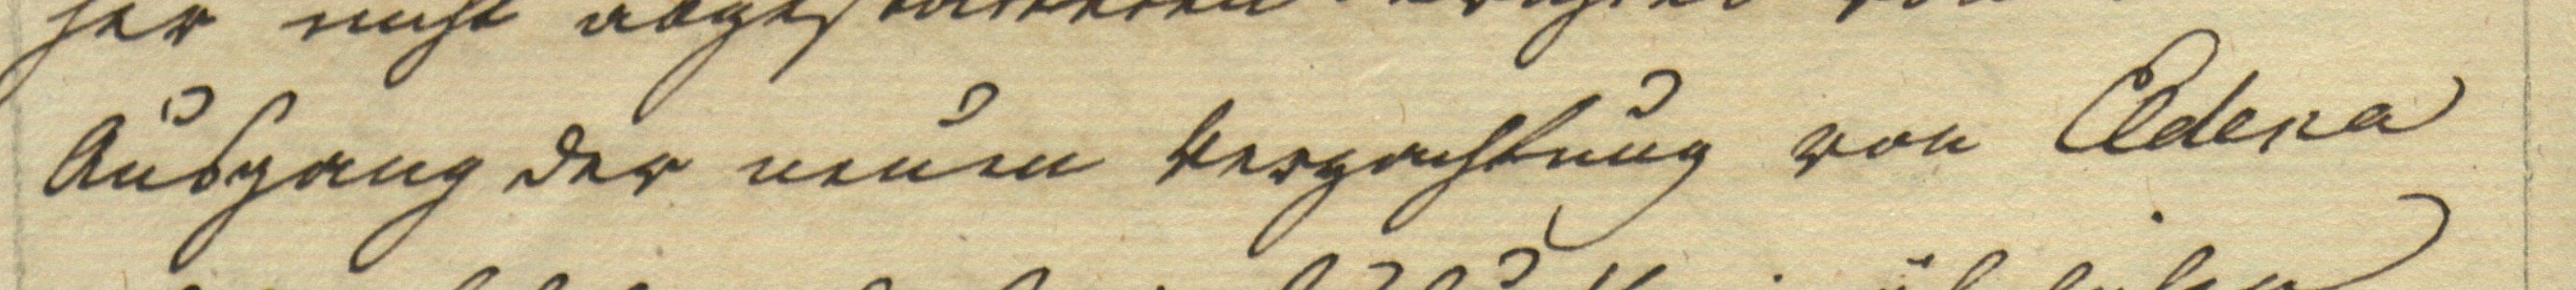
Ausgang der neuen Verpachtung von Eldena
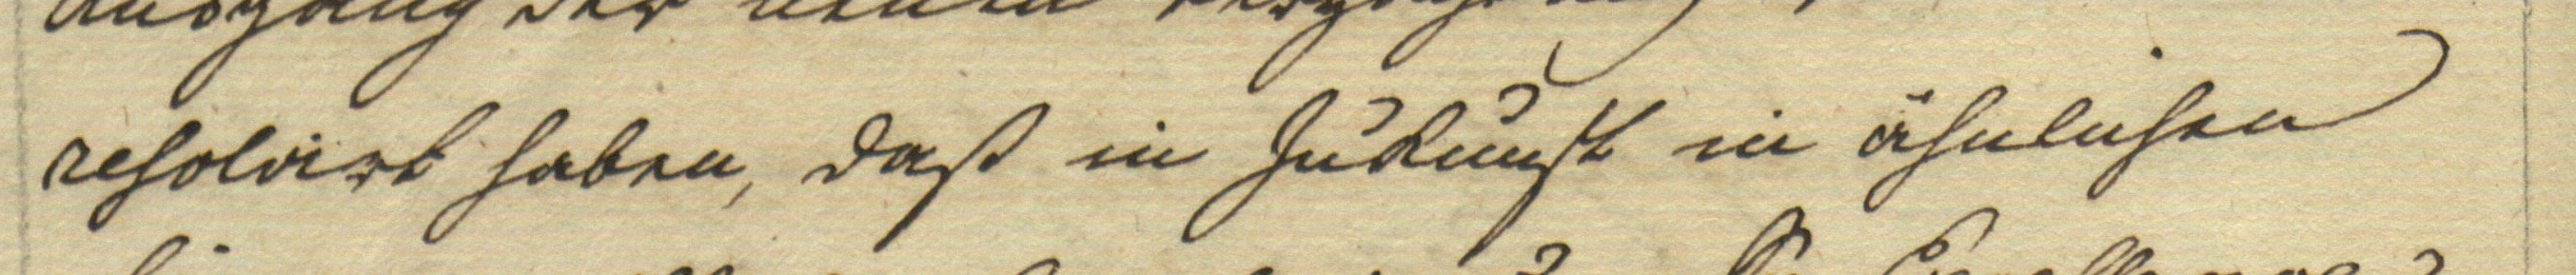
resolvirt haben, daß in Zukunft in ähnlichen
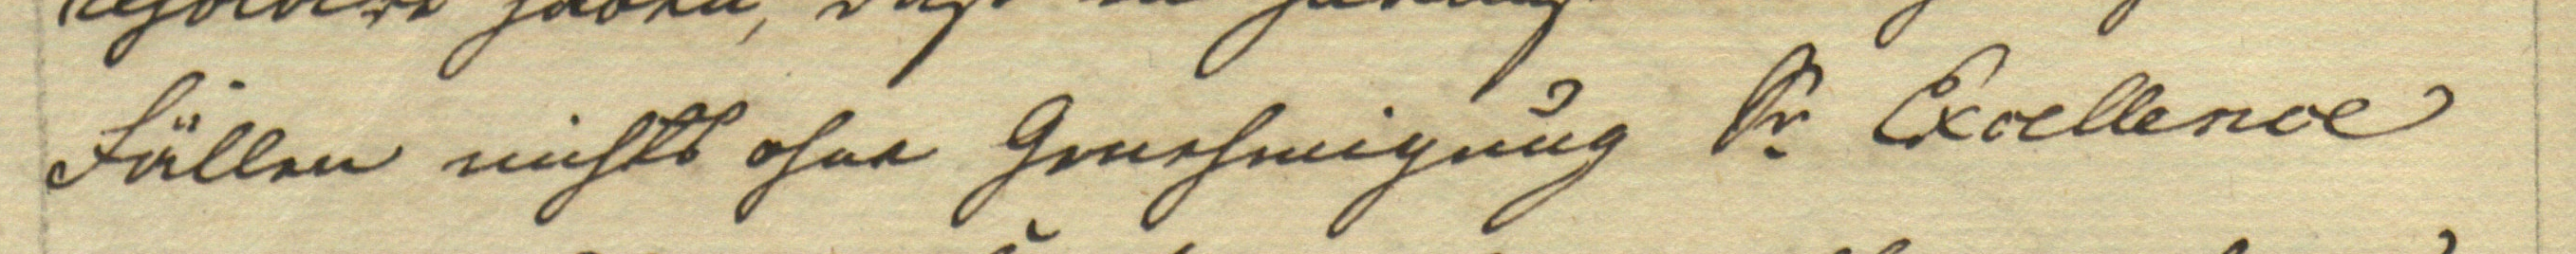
Fällen nichts ohne Genehmigung Sr Excellence
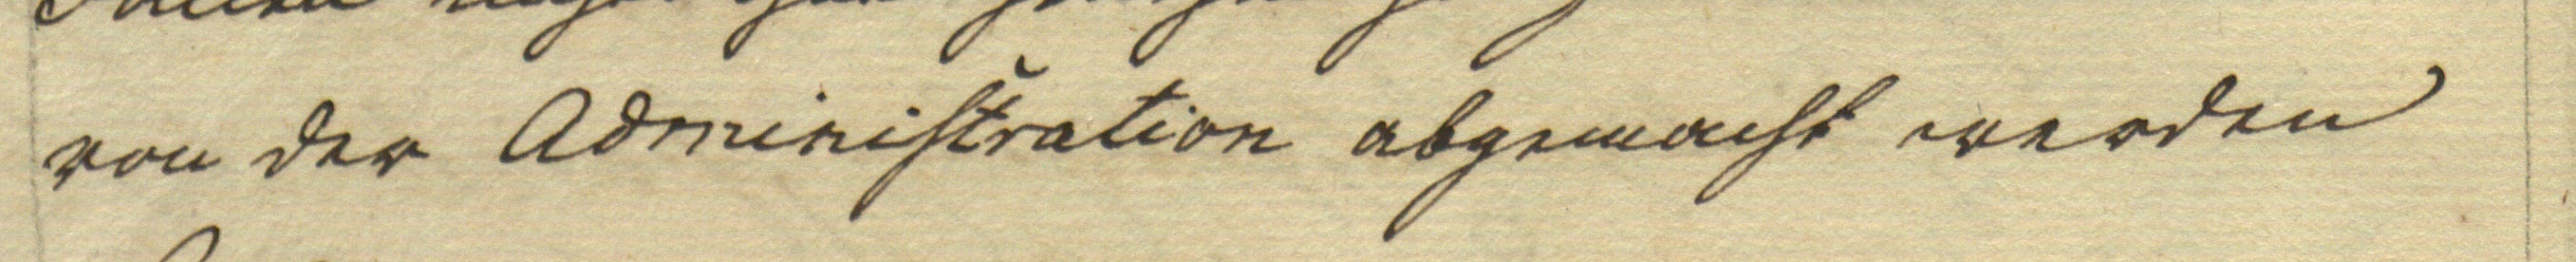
von der Administration abgemacht werden
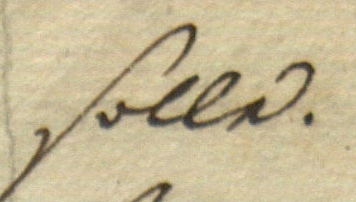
solle.
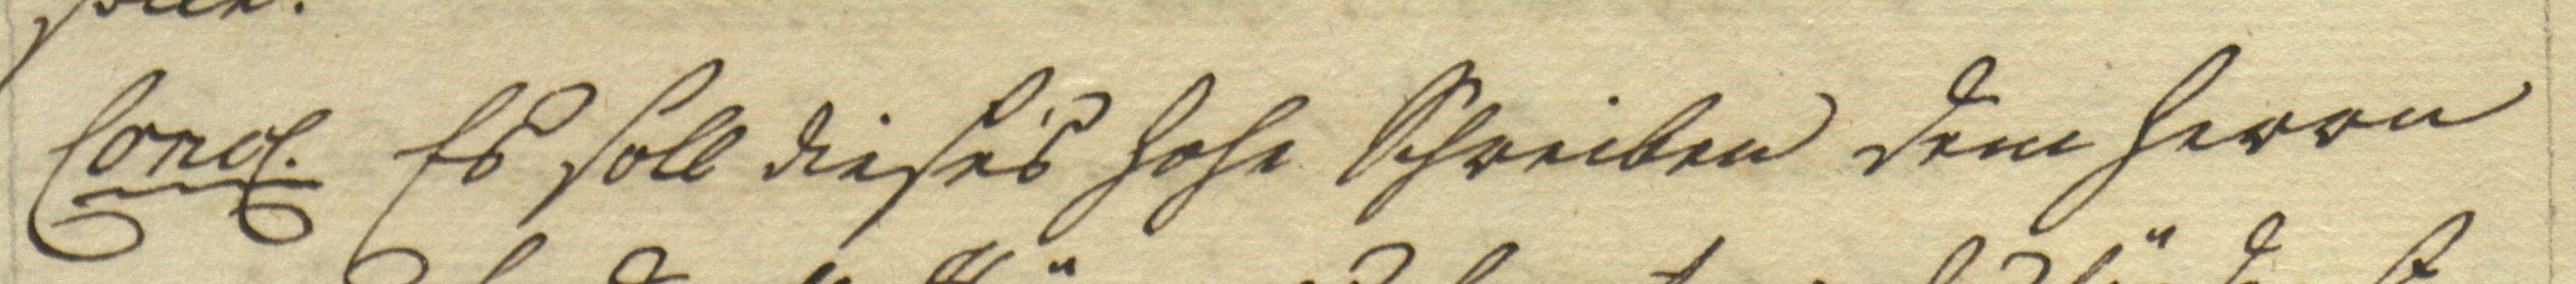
Concl. Es so dieses hohe Schreiben dem Herrn
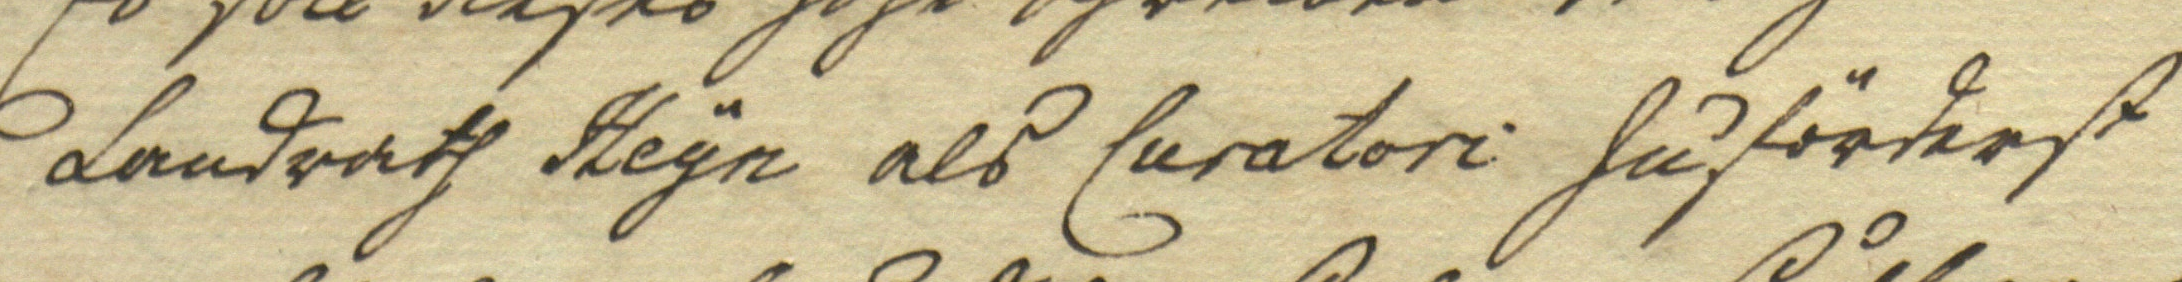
Landrath Heÿn als Curatori zuförderst
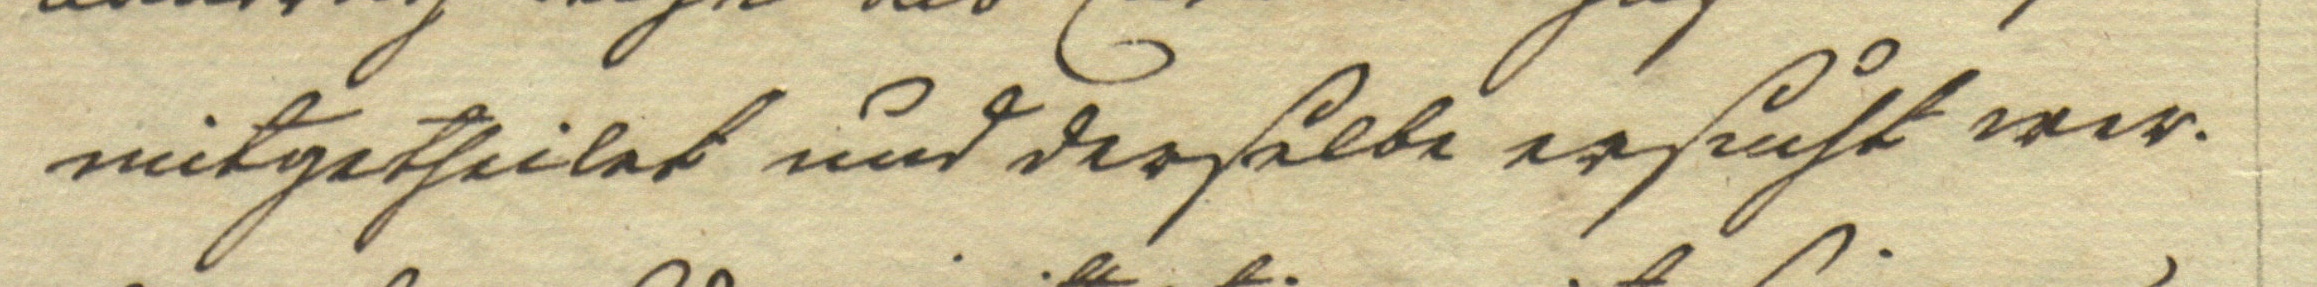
mitgetheilet und derselbe ersucht wer¬
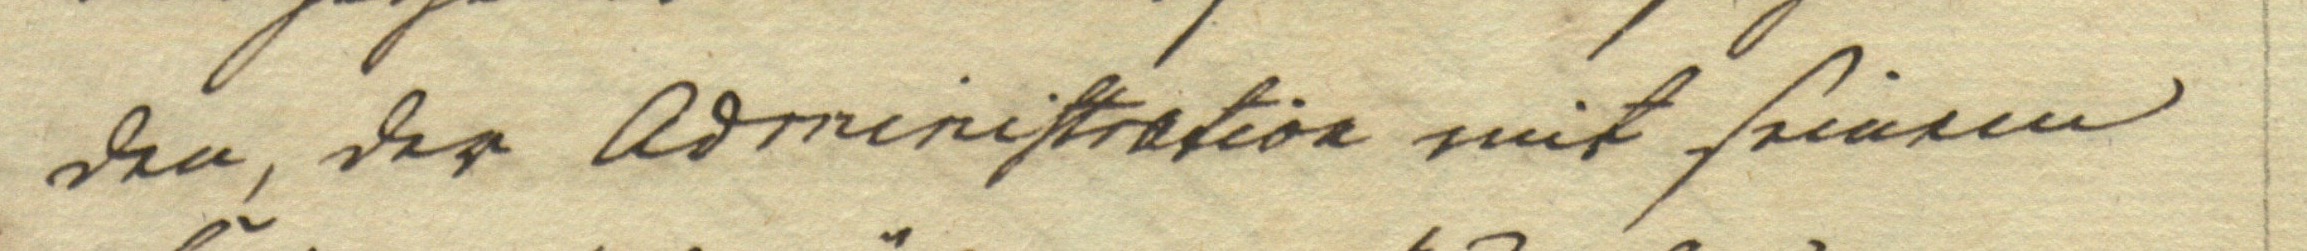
den, der Administration mit seinem
